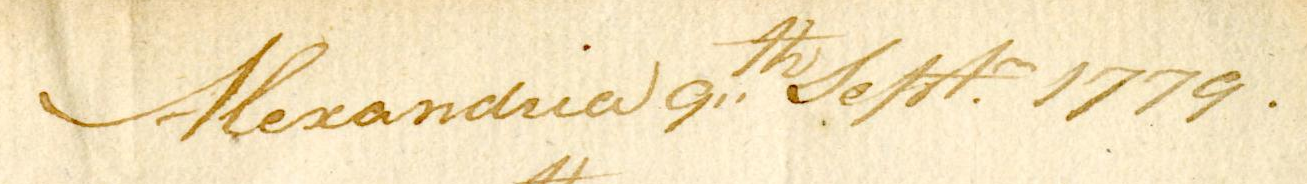Alexandria 9^th. Sept^r. 1779
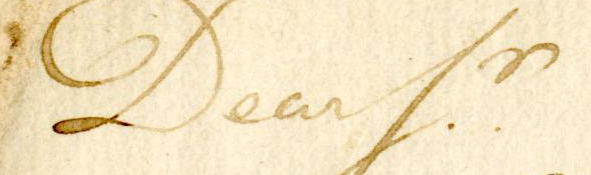Dear S^r
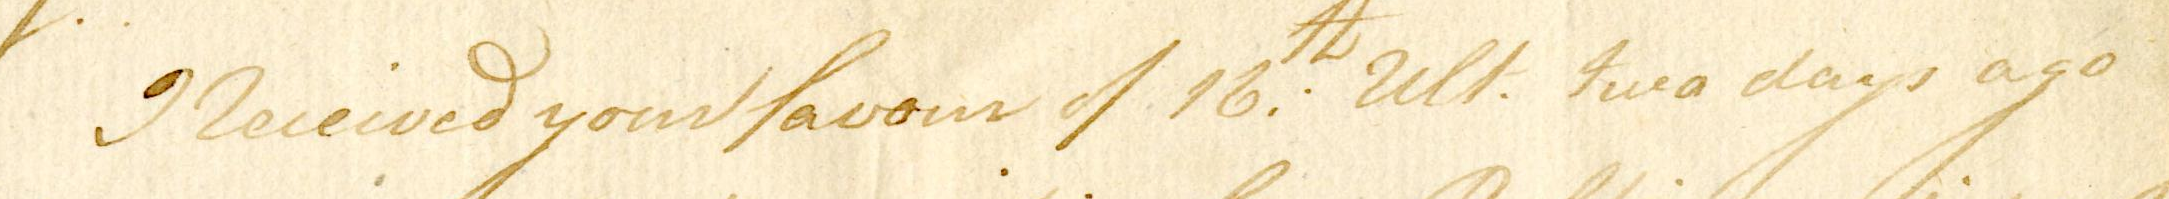I received your favour of 16^th. Ult. two days ago
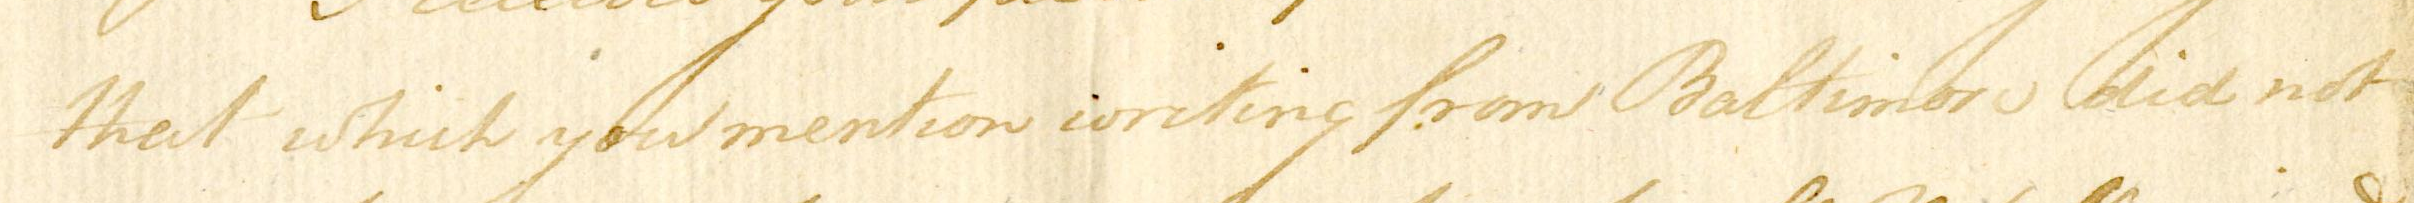that which you mention writing from Baltimore did not
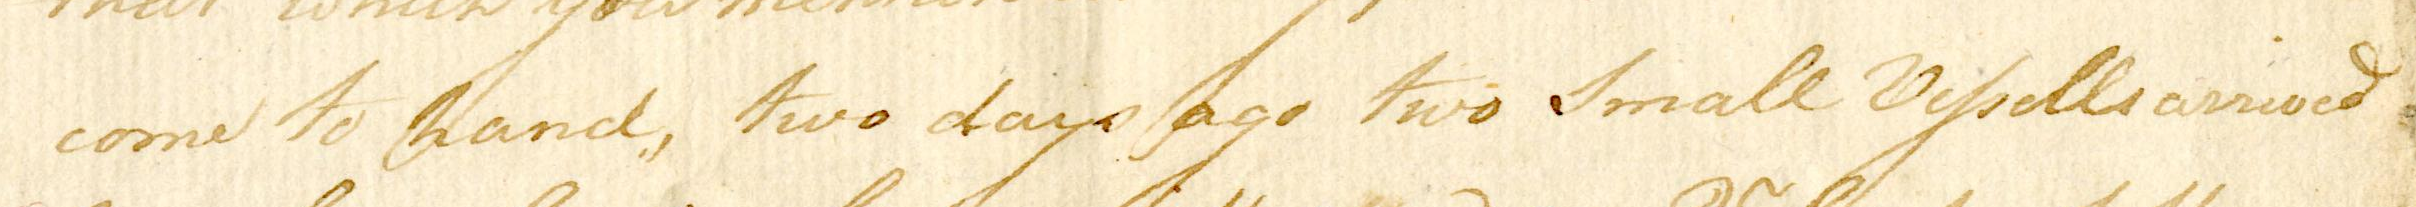come to hand, two days ago two Small Vissells arrived
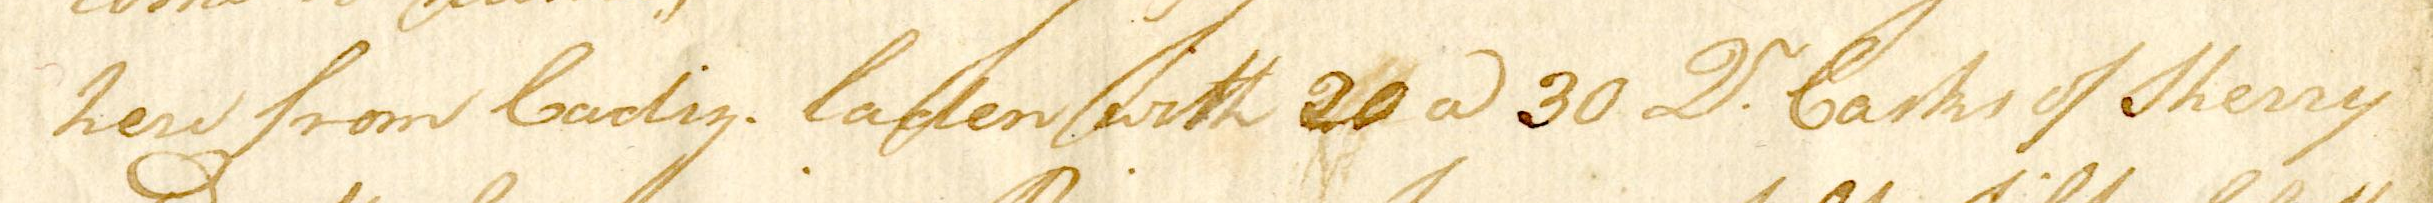here from Cadiz. laden with 20 @ 30 Q^r. Casks of Sherry
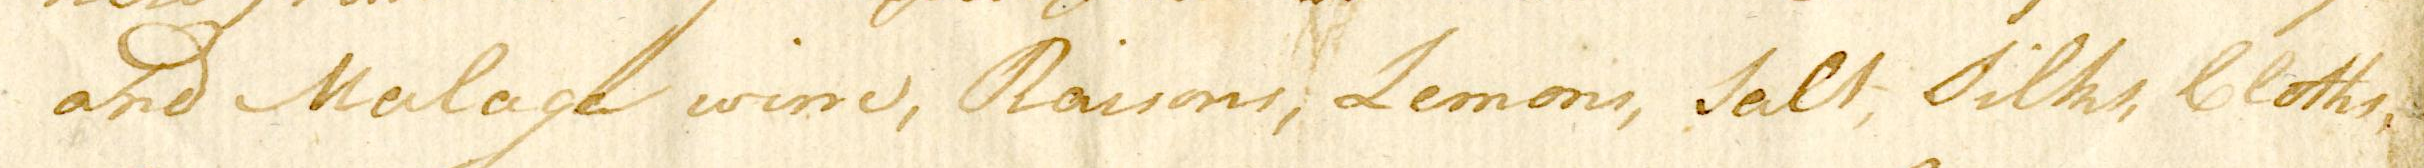and Melage wire, raisons; Lemons, Salt, Silks, Cloths
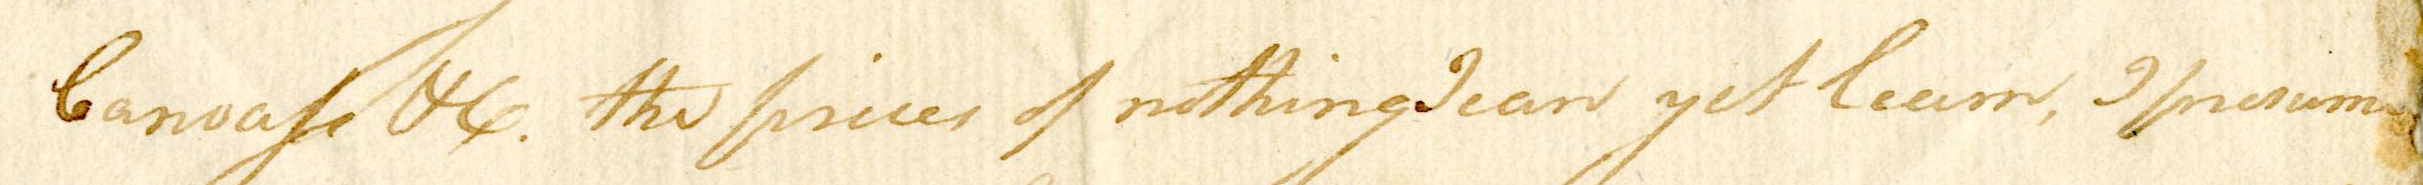Canvass & the price of nothing dear yet learn, I presum
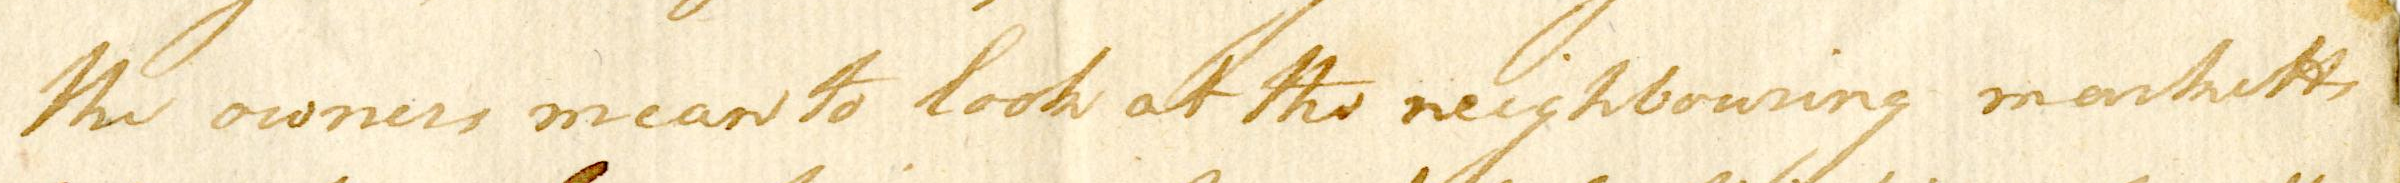the owners mean to look at the neighboring markets
